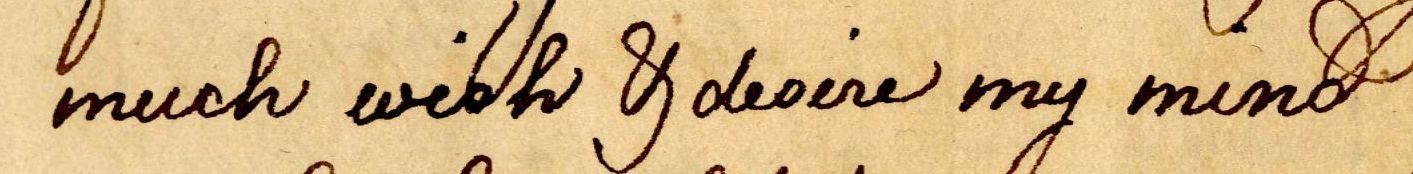much wish & desire my mind
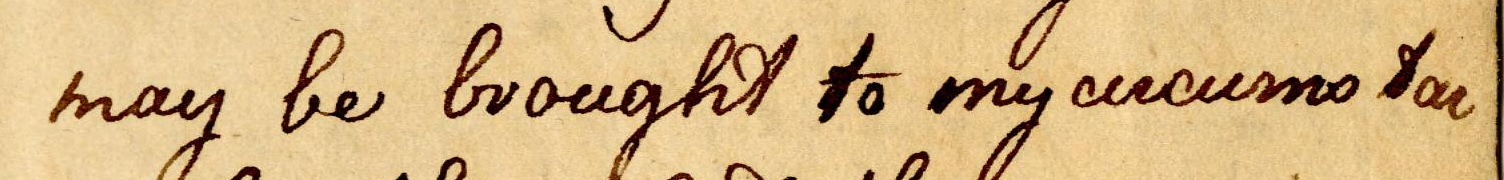may be brought to my circumstan
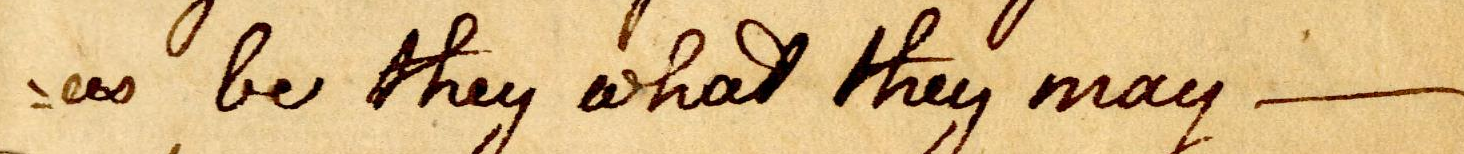-ce be they what they may-
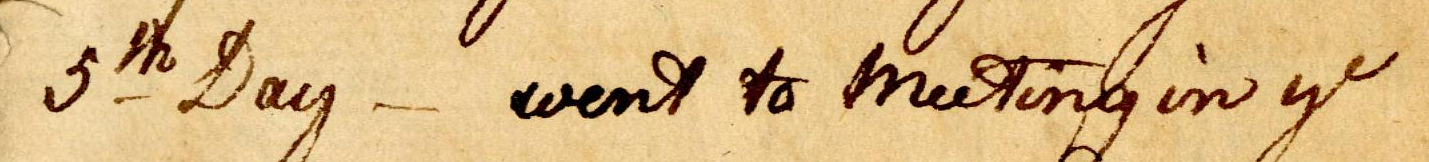5^th. Day- went to Meeting in y^e
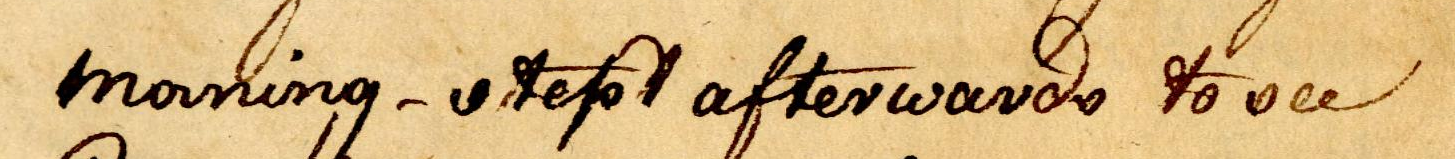morning- stept afterwards to see
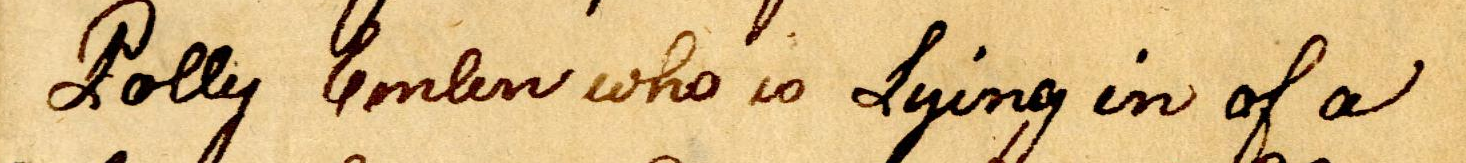Polly Emlen who is Lying in of a
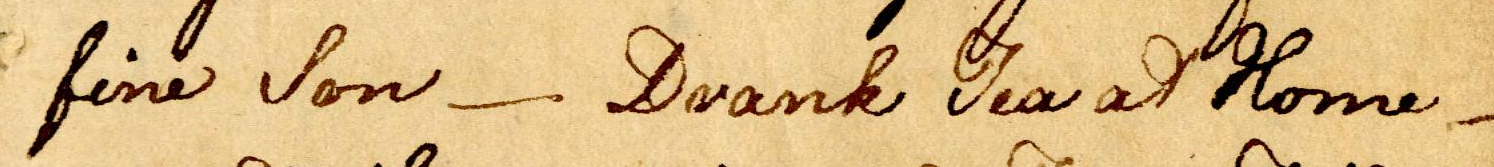fine Son- Drank Tea at Home -
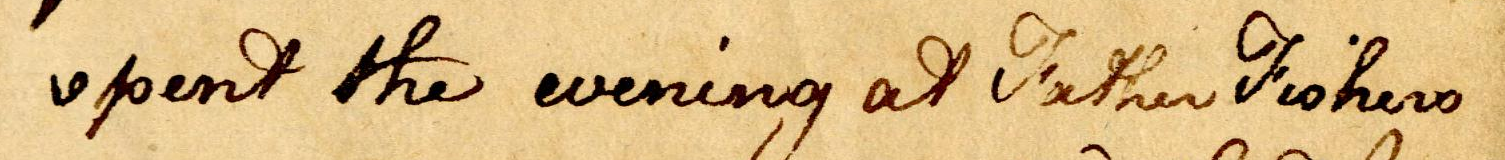spent the evening at Father Fishers
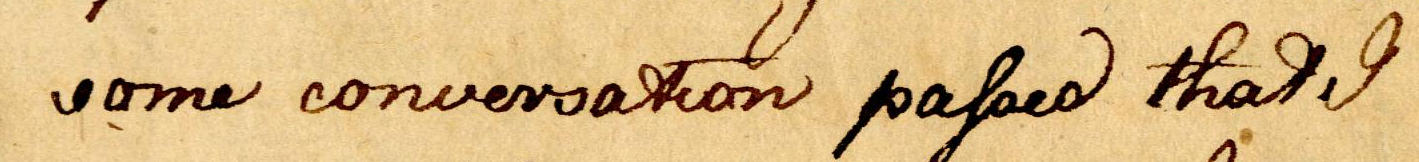some conversation passed that I
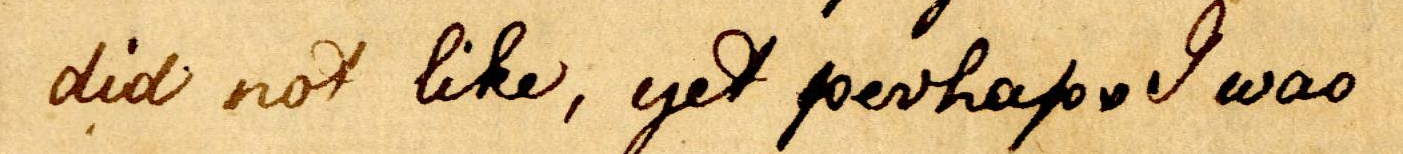did not like, yet perhaps I was
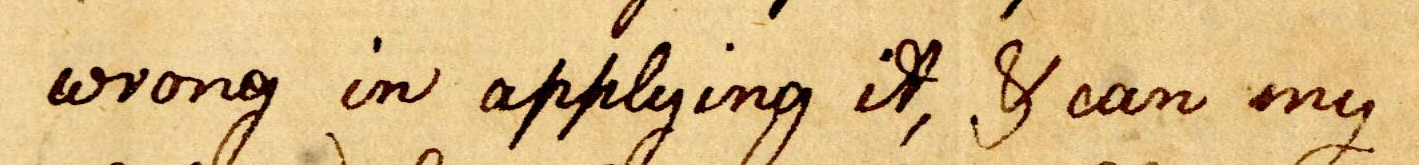wrong in applying it, & can my
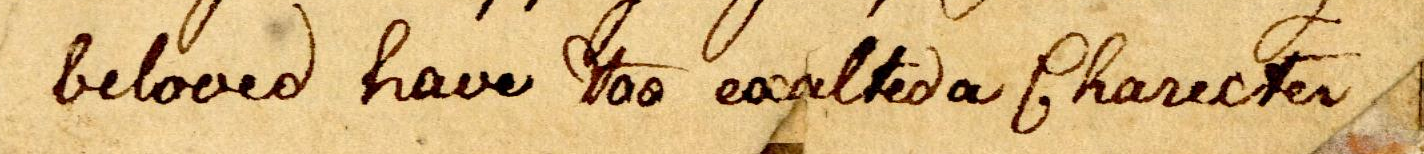beloved have too exalted a Charecter
